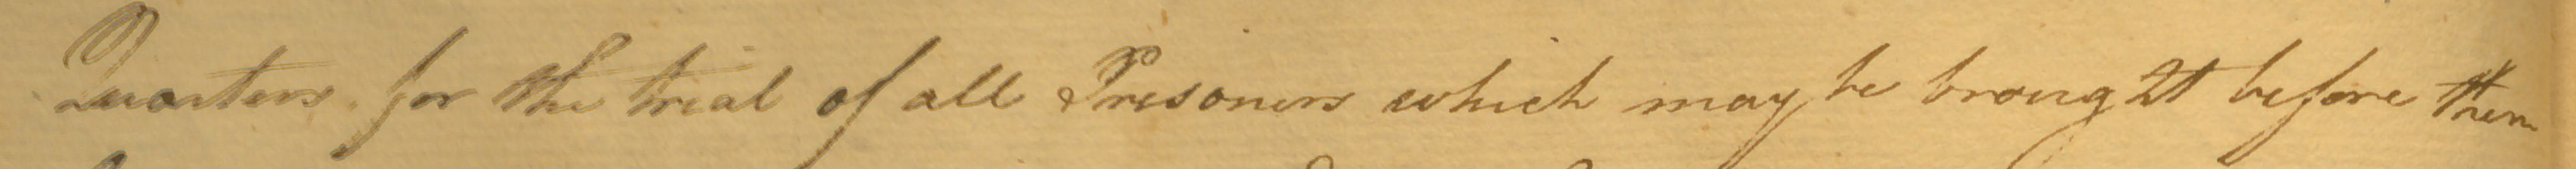Quarters for the trial of all Prisoners which may be brought before them
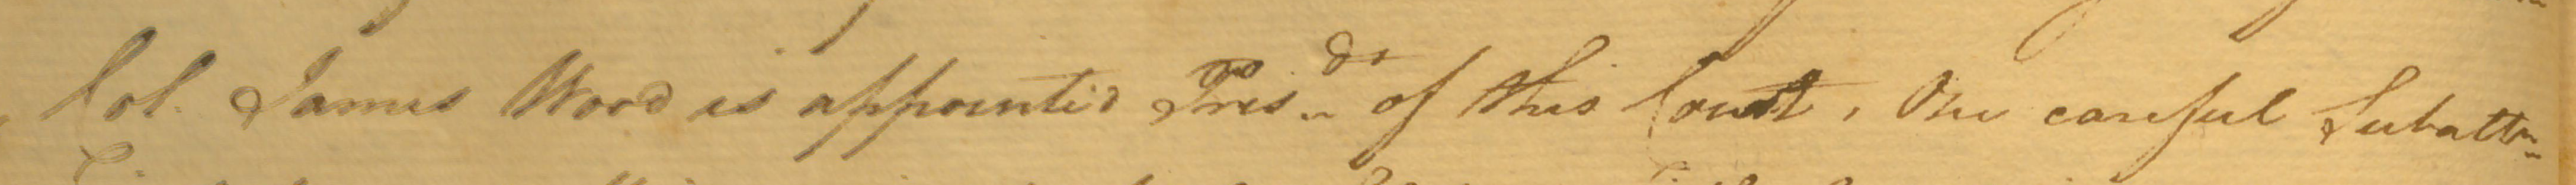Col. James Wood is appointed Pres^dt of this Court. One careful Subalt^n
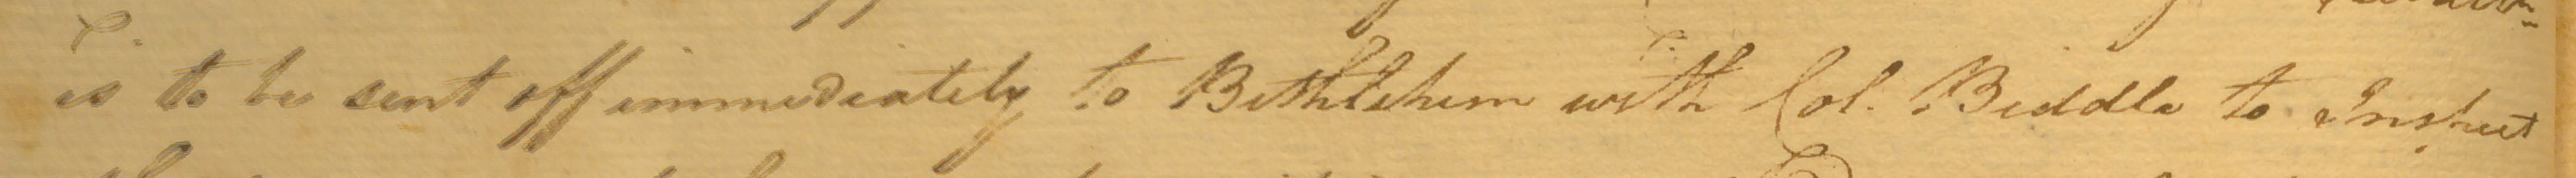is to be sent off immediately to Bethlehem with Col. Biddle to Instruct
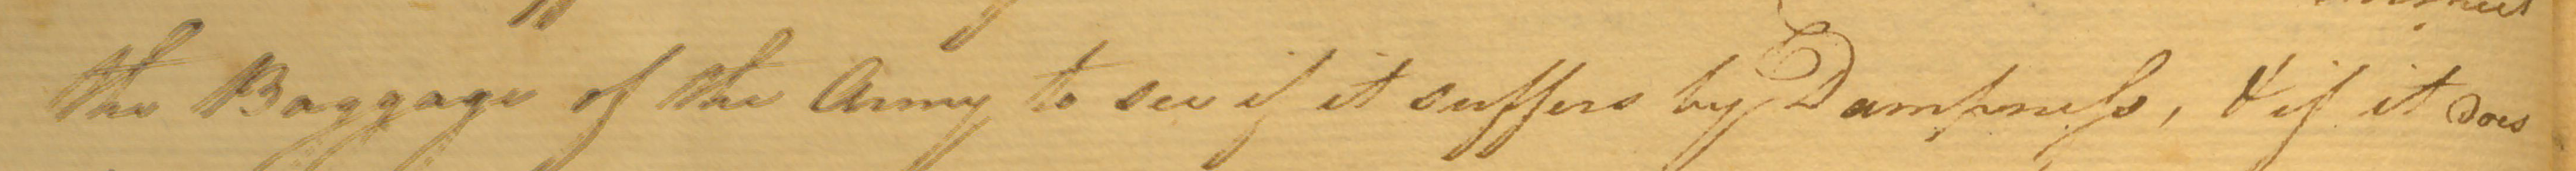the Baggage of the Army to see if it suffers by Dampness, & if it does
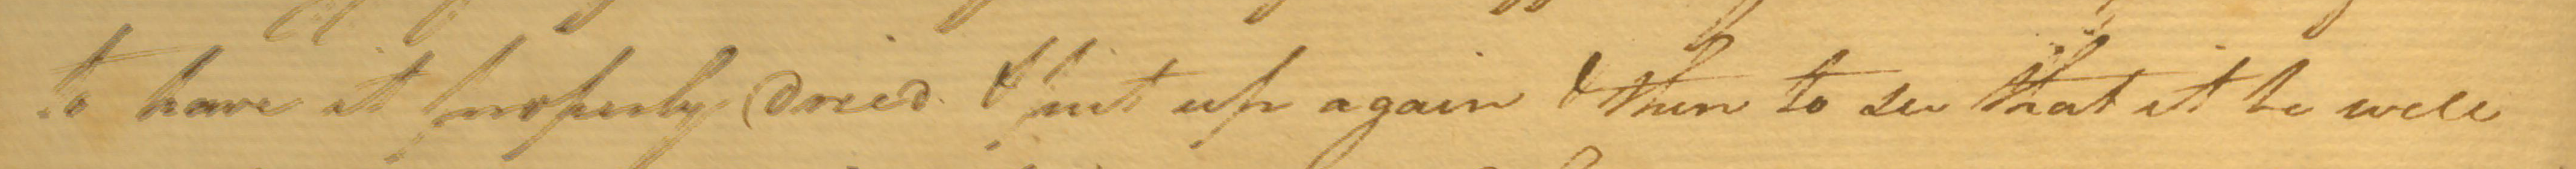to have it properly dried & put up again & then to see that it be well
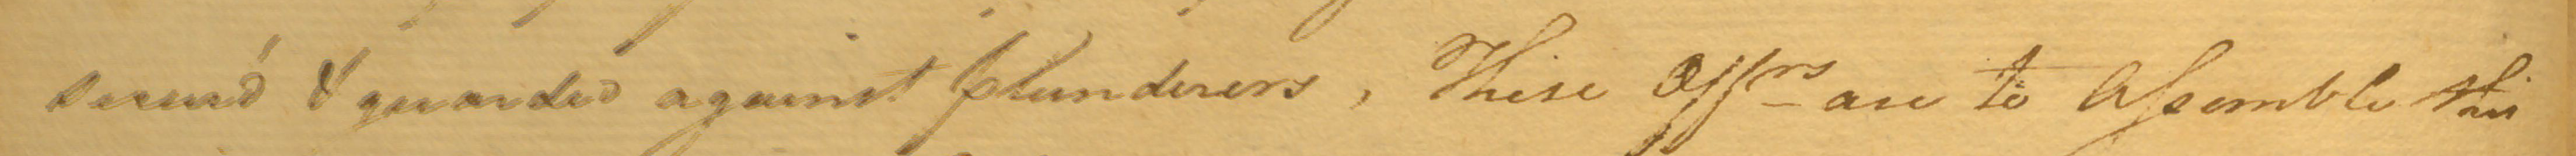secured & guarded against plunderers, These Off^rs are to Assemble this
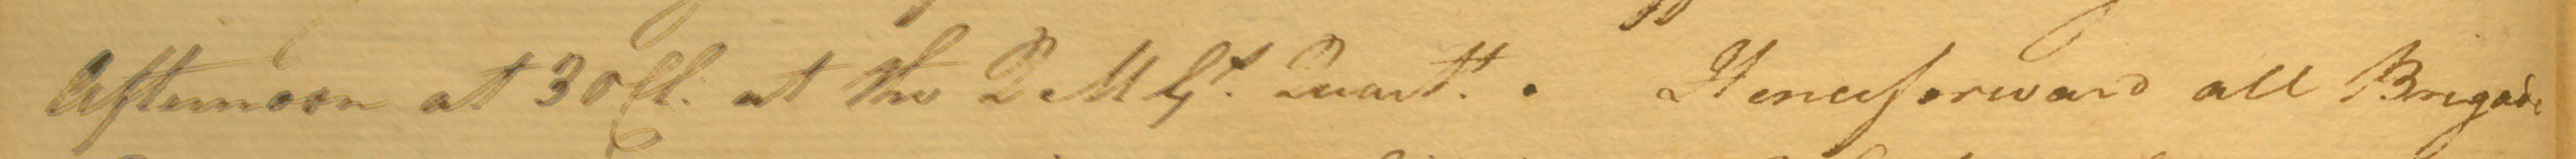Afternoon at 3 oCl. at the QMG^l. Quart^s. Henceforward all Brigade
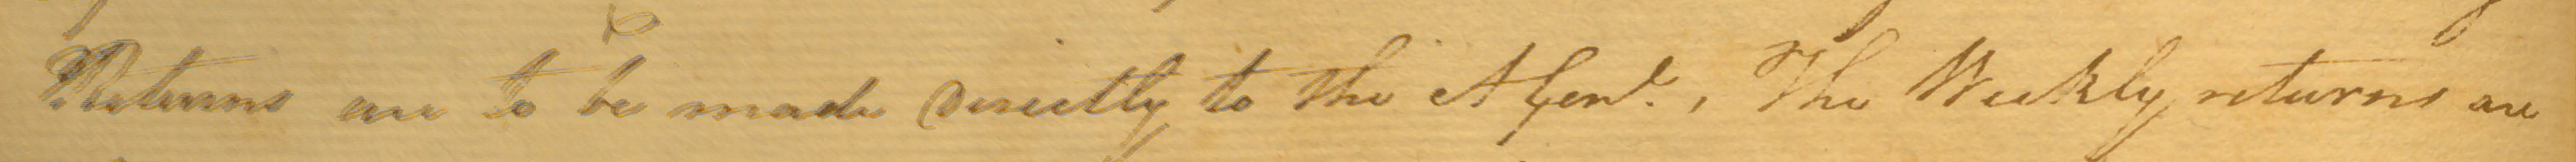Returns are to be made directly to the A Gen^l. The Weekly returns are
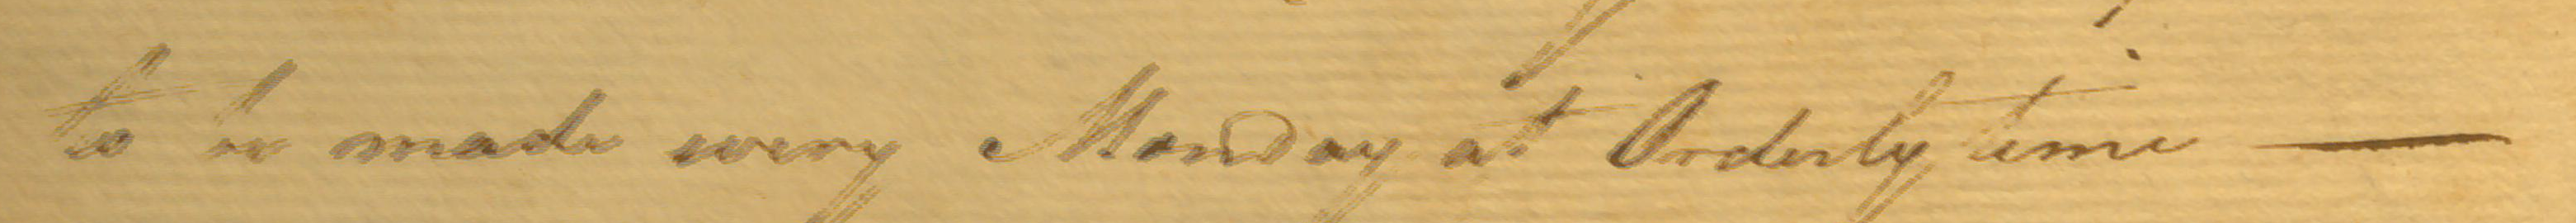to be made every Monday at Orderly time-
